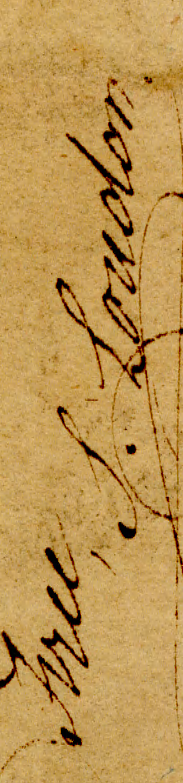Free, S. Loudon
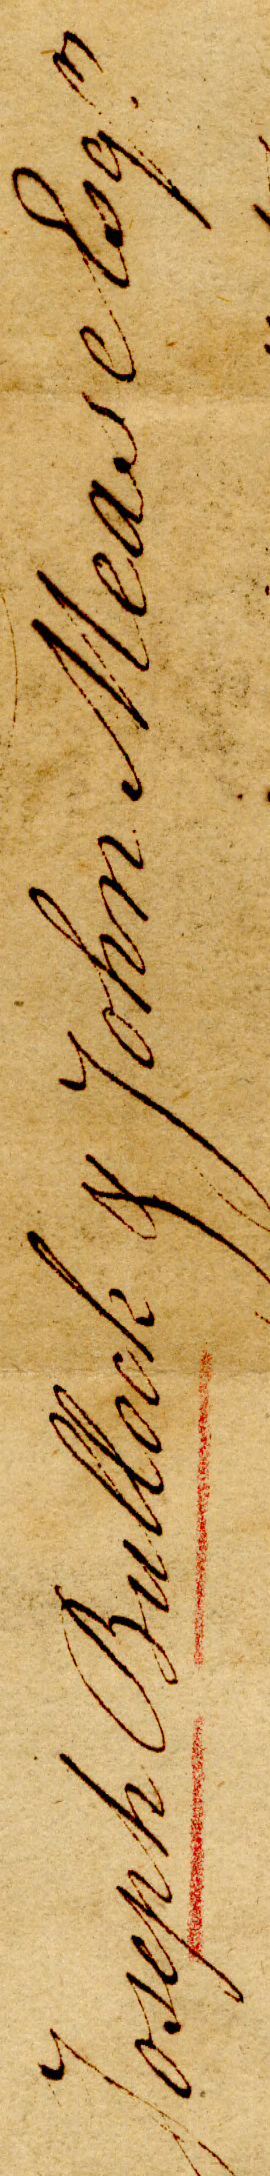Joseph Bullock & John Mease Esq^r.
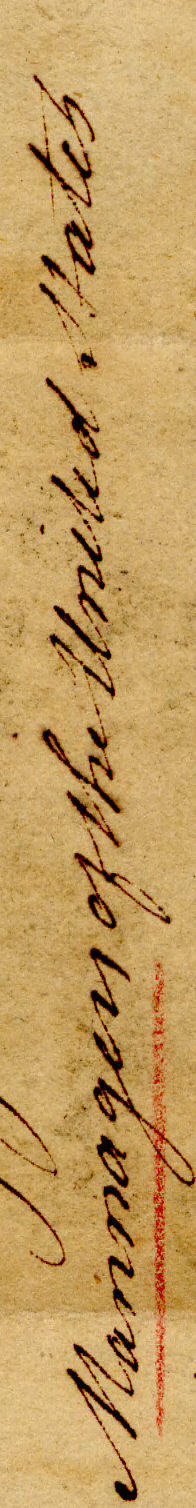Managers of the United States
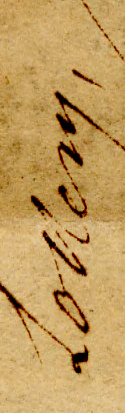Lottery,
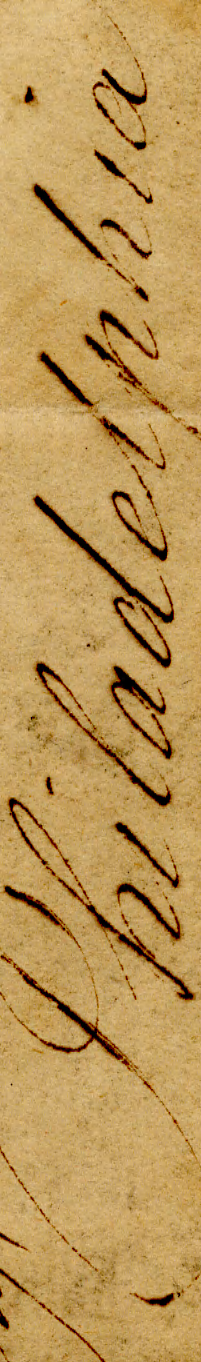Philadelphia
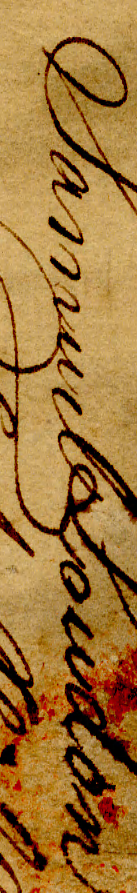Samuel Loudon
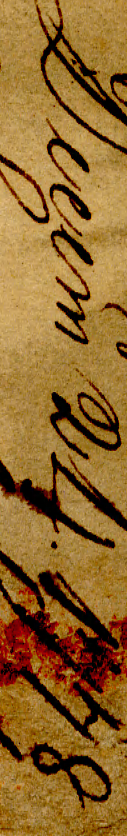Decem^r 24^th. 1778
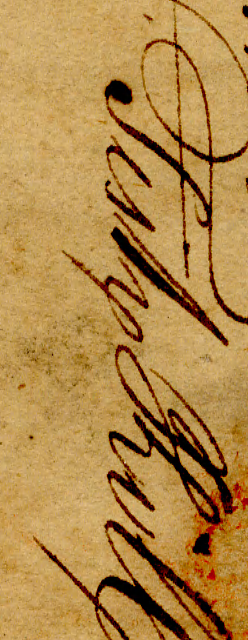Fish Kill
